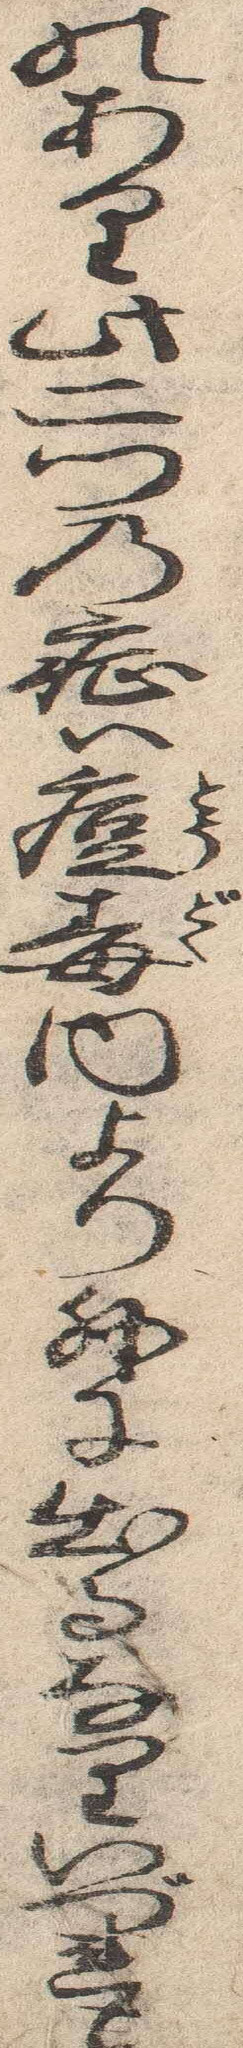のあり此二つの症は痘毒内より外に出るなりいづれも
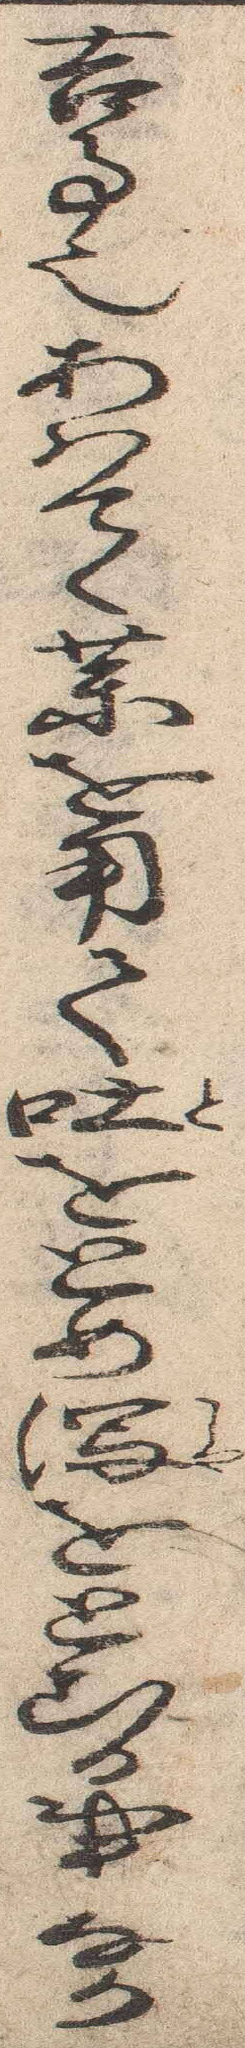吉事也あわてゝ薬を用て吐をとめ瀉をとむる事なか
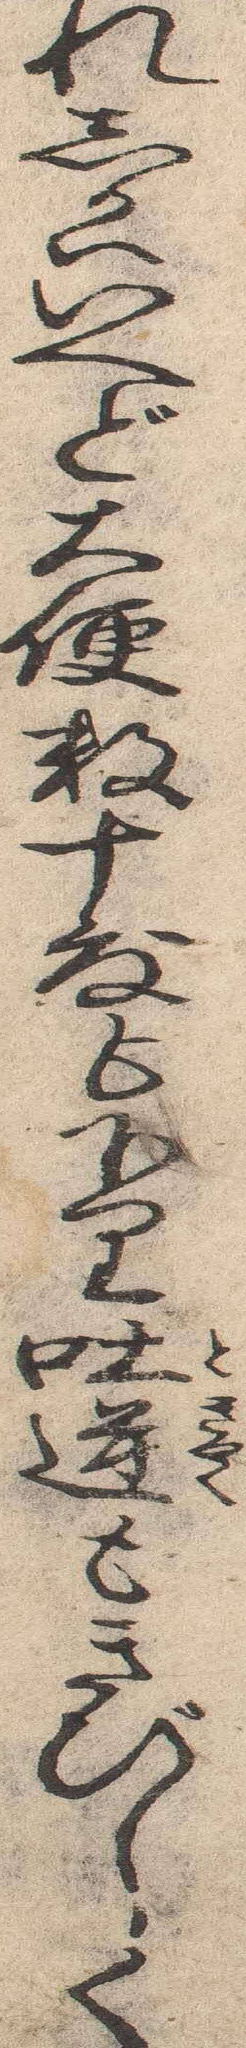れしかいへど大便数十度も下り吐逆もきびしく

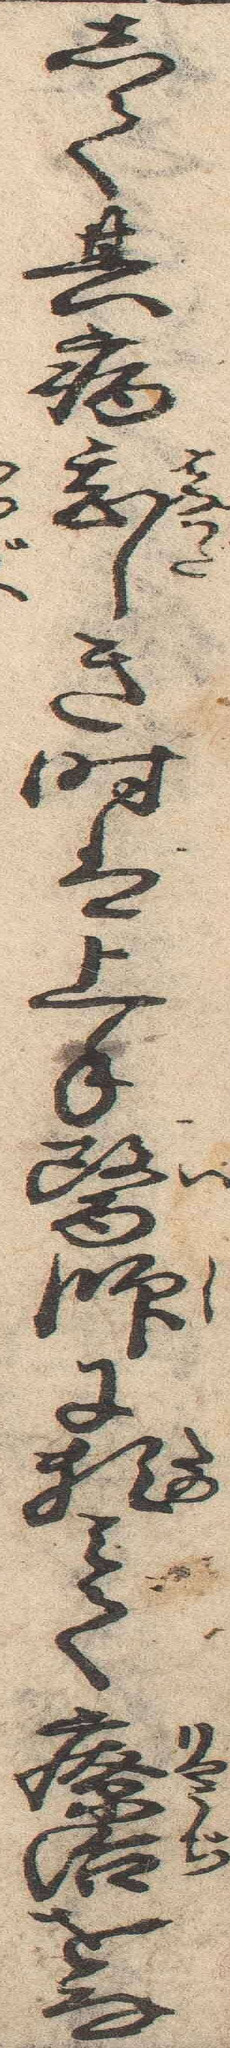して其病甚しき時は上手医師に頼みて療治をな
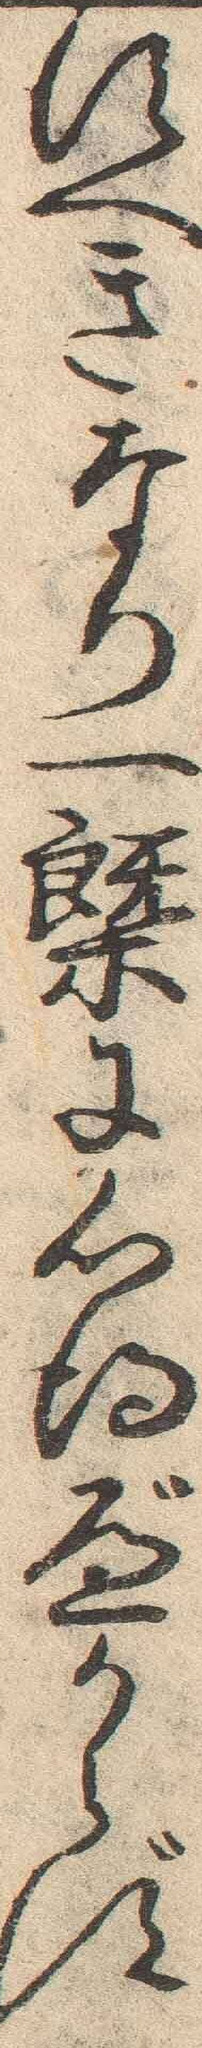すへきなり一概に心得べからず
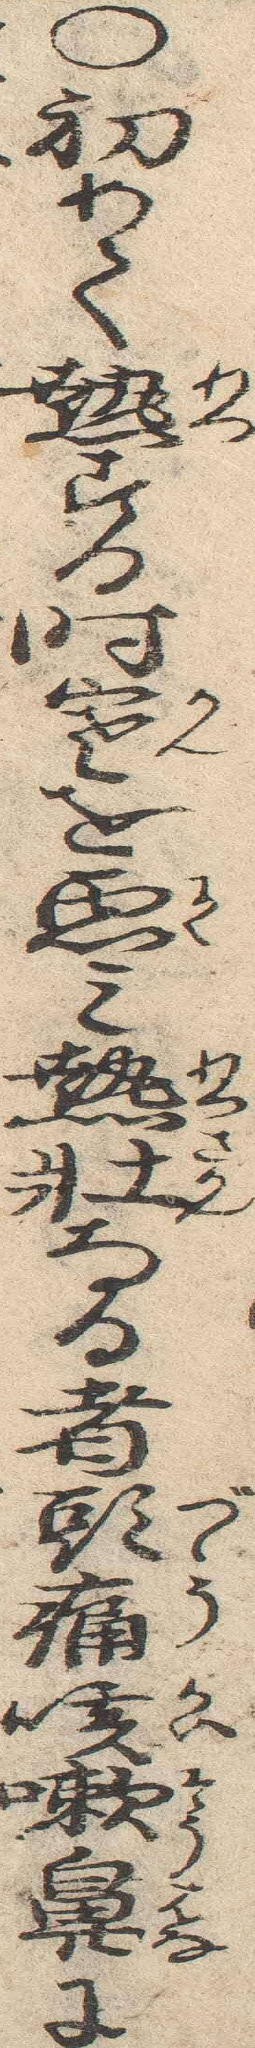○初めて熱する時寒を悪み熱壮なる者頭痛咳嗽鼻に
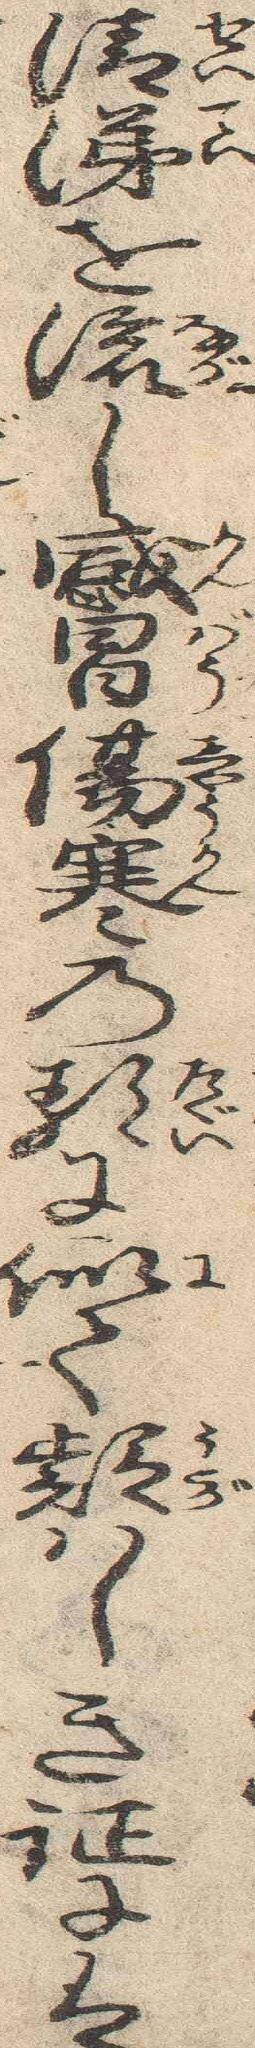清涕を流し感冒傷寒の類に似て疑はしき証には
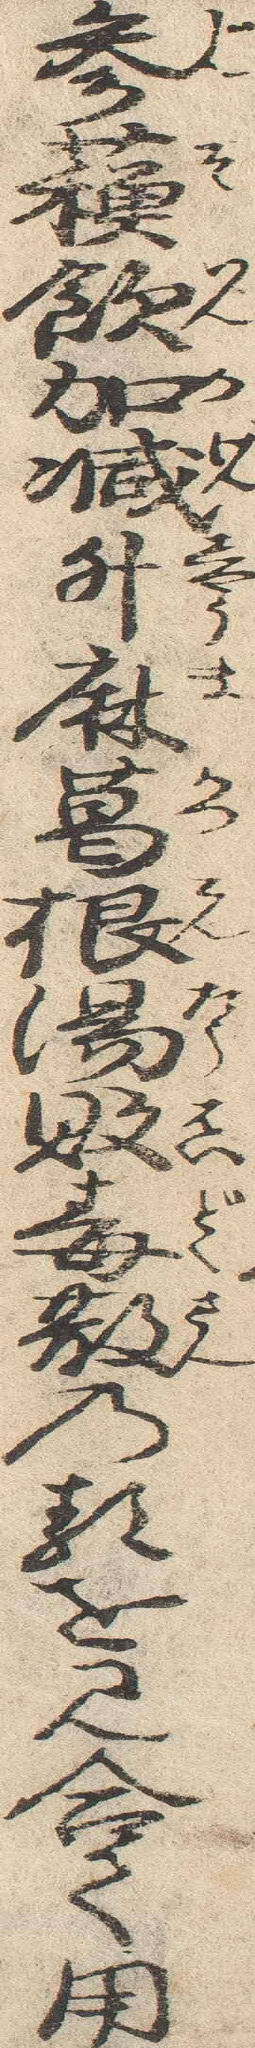参蘇飲加減升麻葛根湯敗毒散類を見合て用
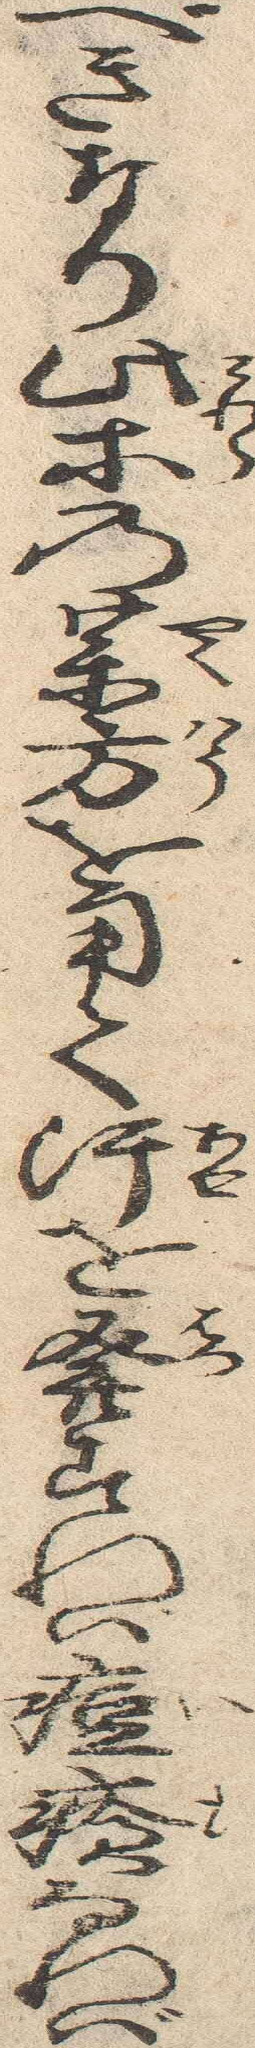べきなり此等の薬方を用て汗を発すれは痘瘡なれば
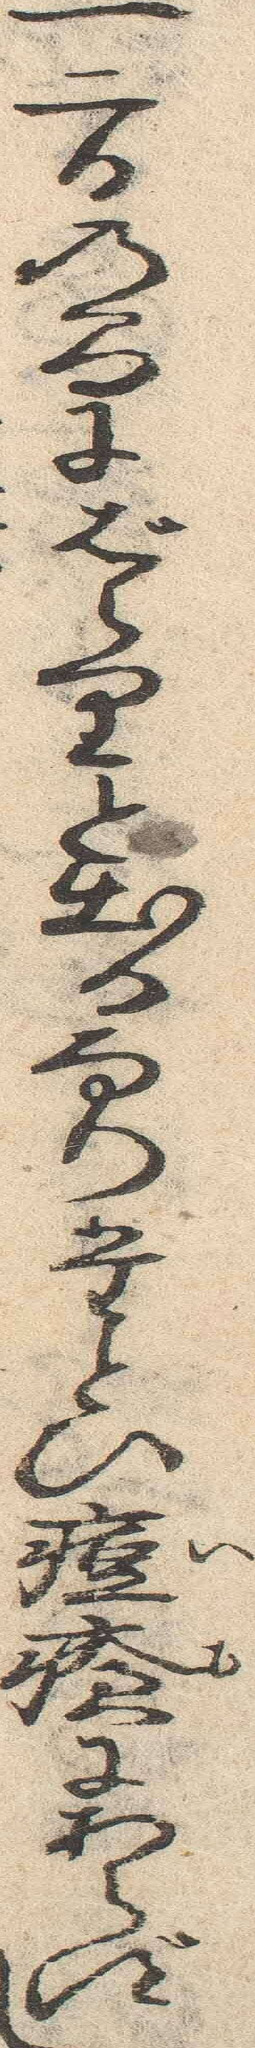一二日の間にばらりと出るなりたとひ痘瘡にあらずし
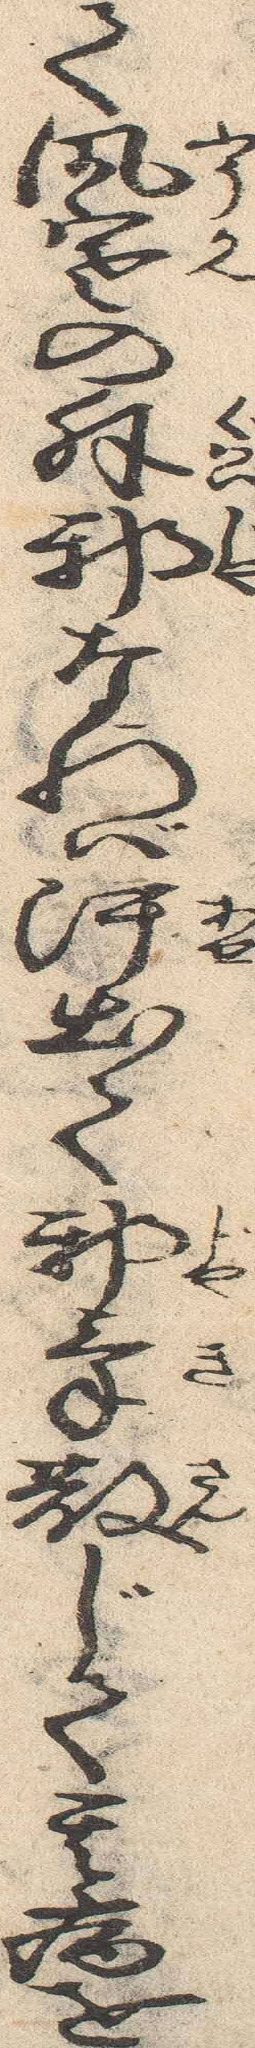て風寒の外邪なれば汗出て邪気散じて其病を
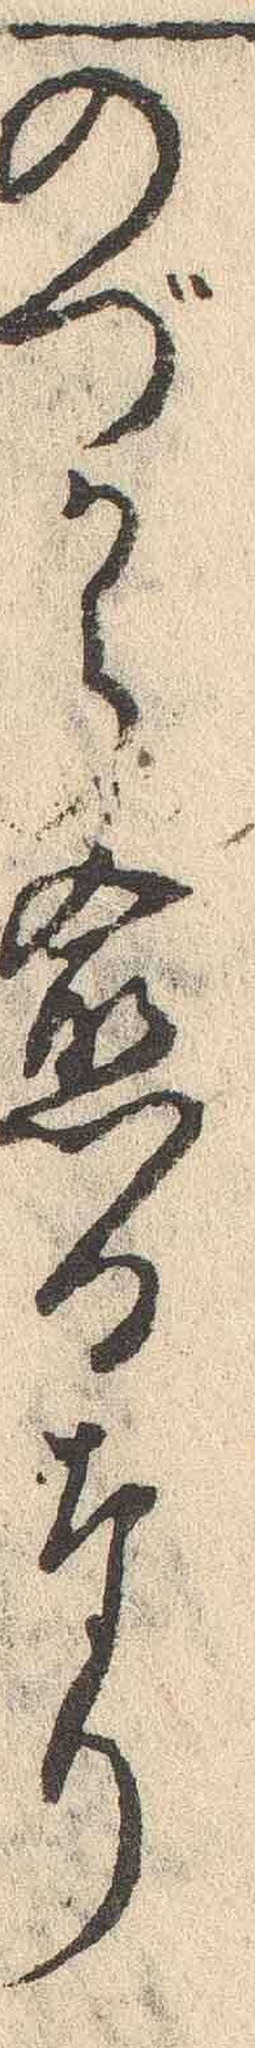のづから愈るなり
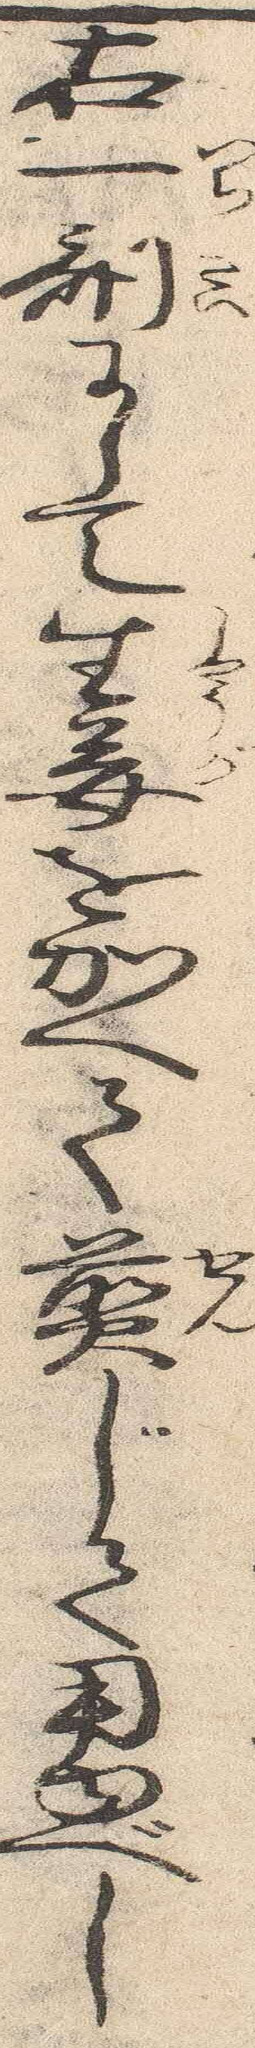右一剤にして生姜を加へて煎じて用ゆべし
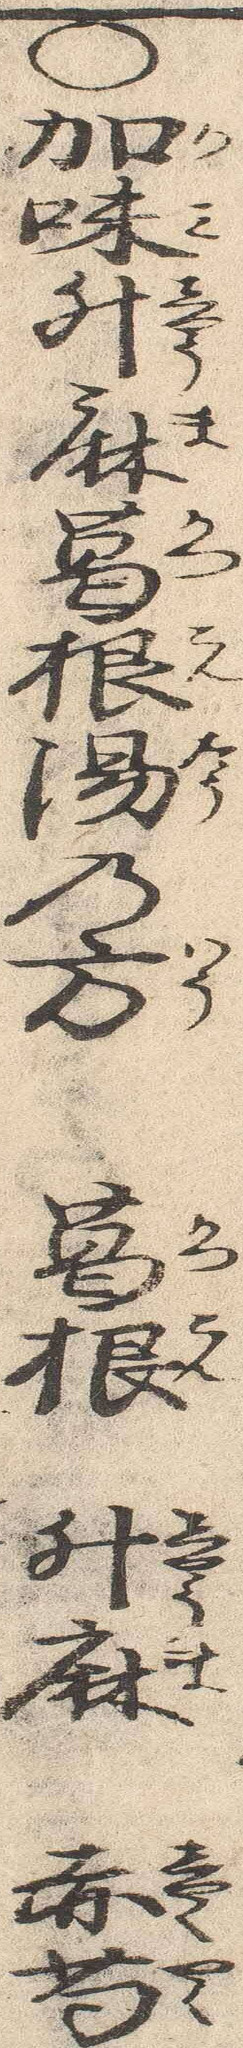○加味升麻葛根湯の方葛根升麻赤芍
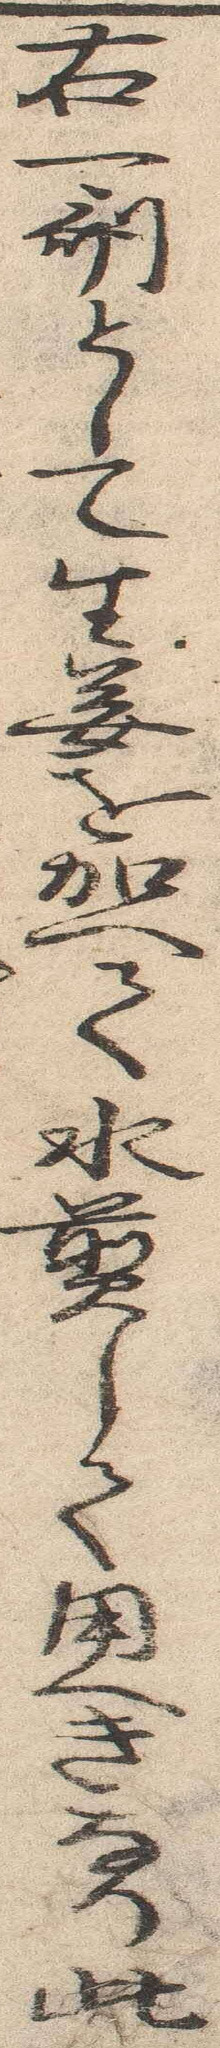右一剤として生姜を加へて水煎して用へきなり此
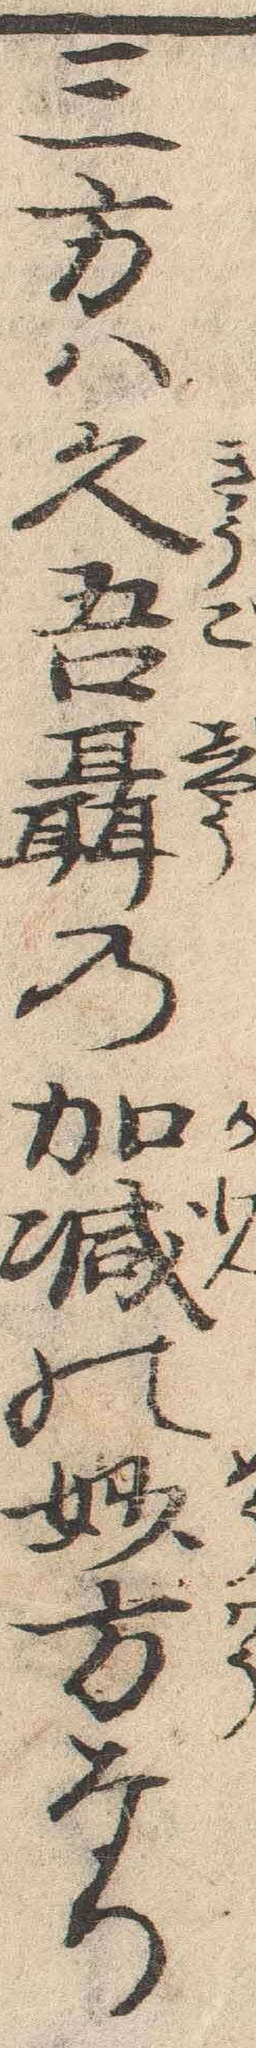三方は久吾聶の加減の妙方なり
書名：小児必用養育草
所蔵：東京学芸大学附属図書館 国文学研究資料館
